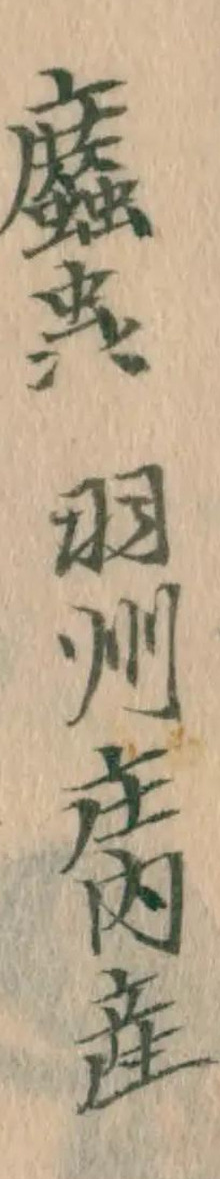蟲羽州庄内産
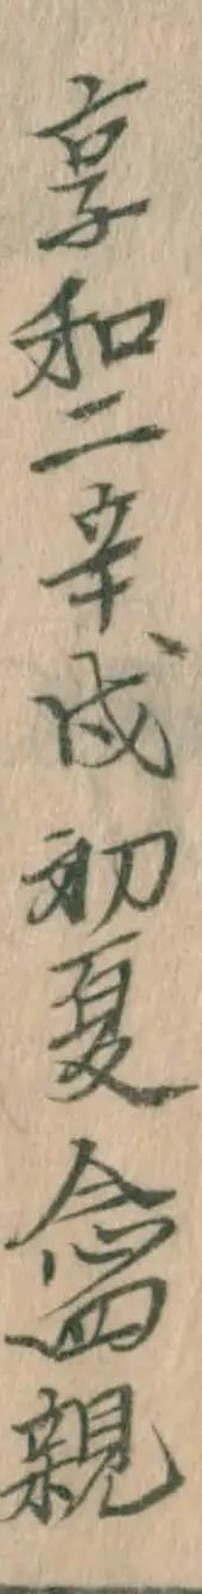享和二辛戌初夏念四親
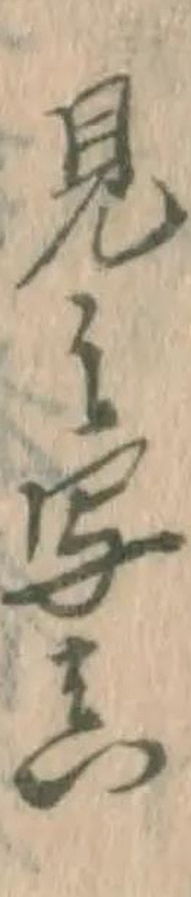見之写真
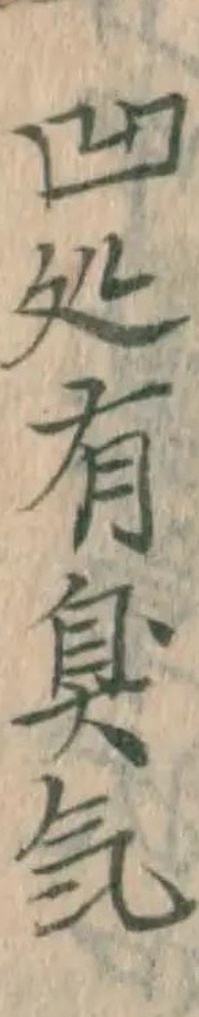凹処有臭気

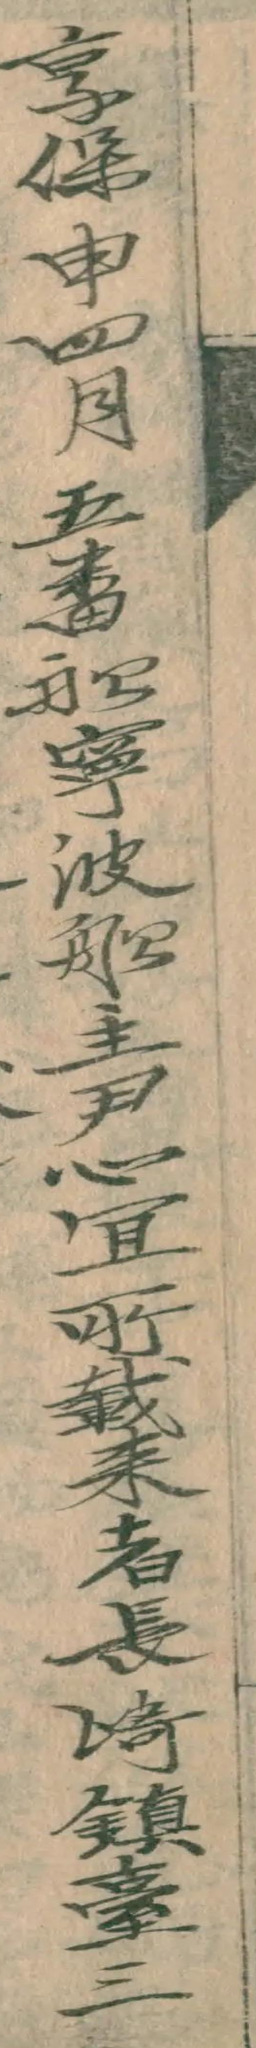享保申四月五番舩ネイ寧波舩主尹心冝所載来者長﨑鎮臺三
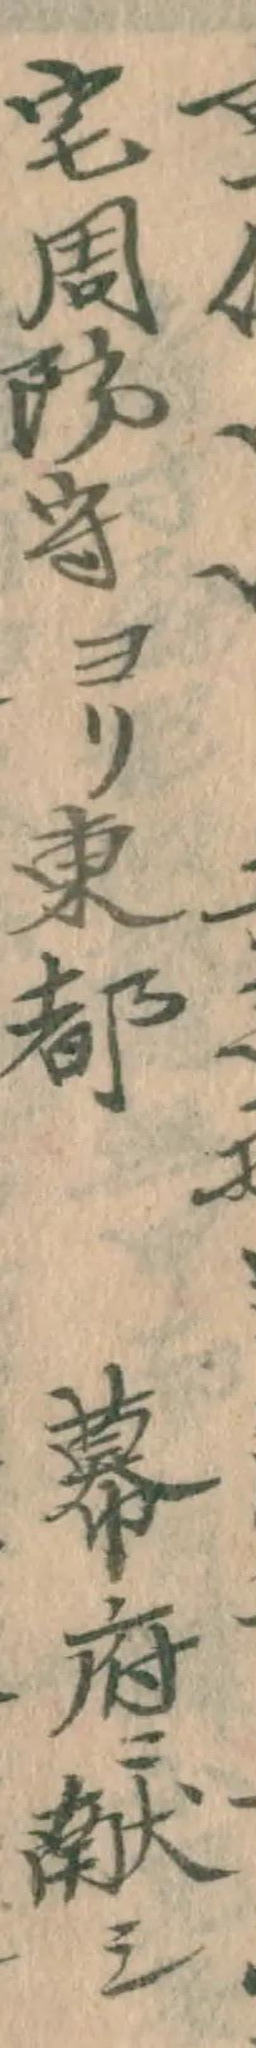宅周防守ヨリ東都幕府ニ献シ
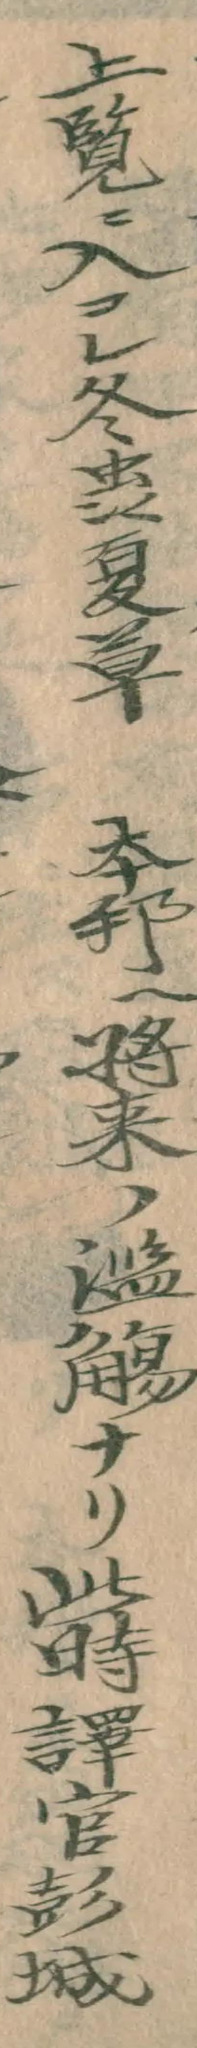上覧ニ入コレ冬蟲夏草本邦ヘ将来ノ濫觴ナリ此時譯官彭城
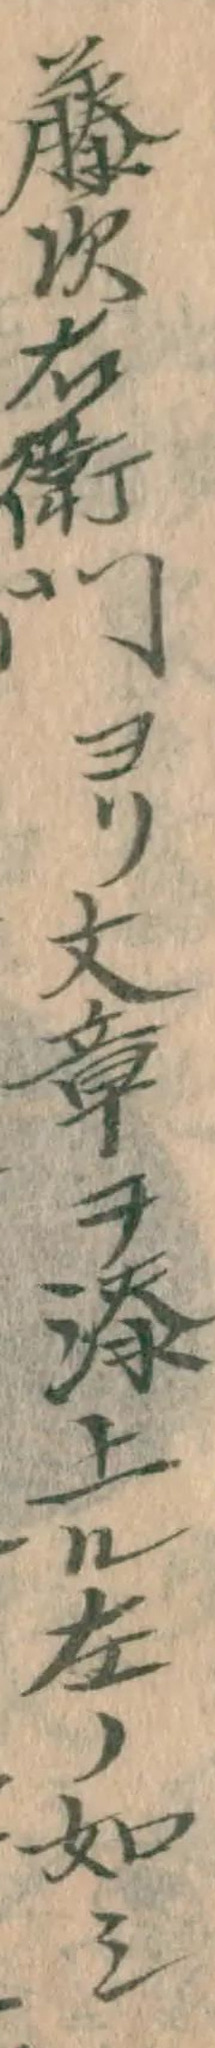藤次右衛門ヨリ文章ヲ湊上ル左ノ如シ
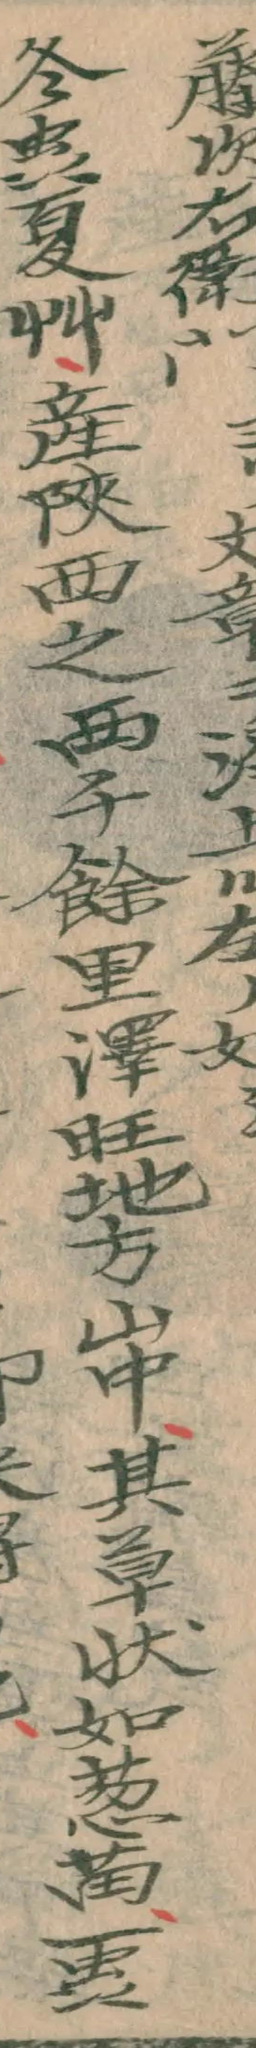冬蟲夏艸、産陝西之西千餘里澤旺地方山中、其草状如葱苗、蟲
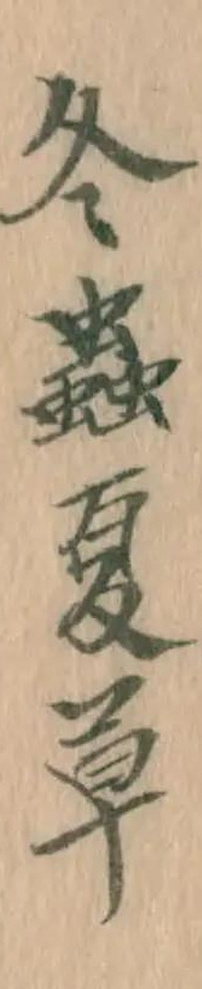冬蟲夏草
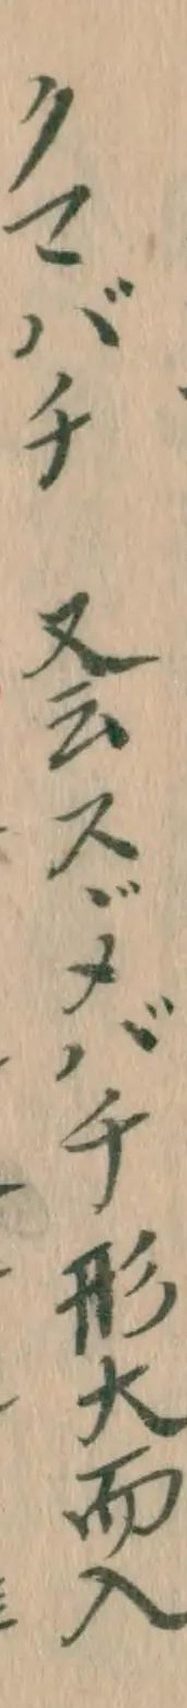クマバチ又云スヾメバチ形大而入
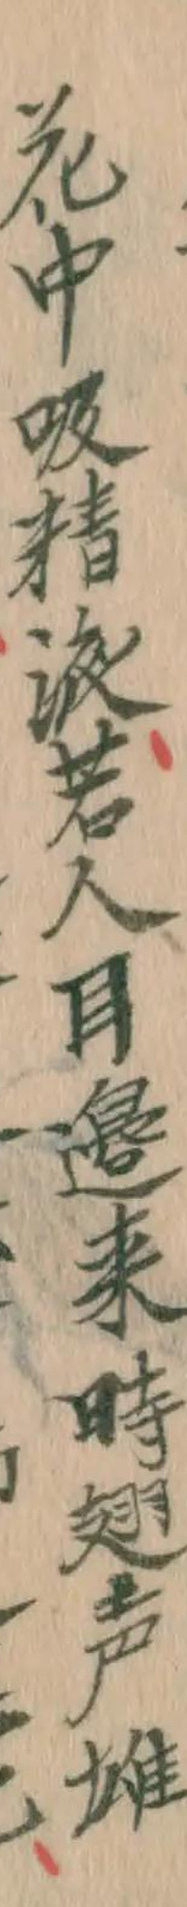花中吸精液、若人月邉来時翅声雄
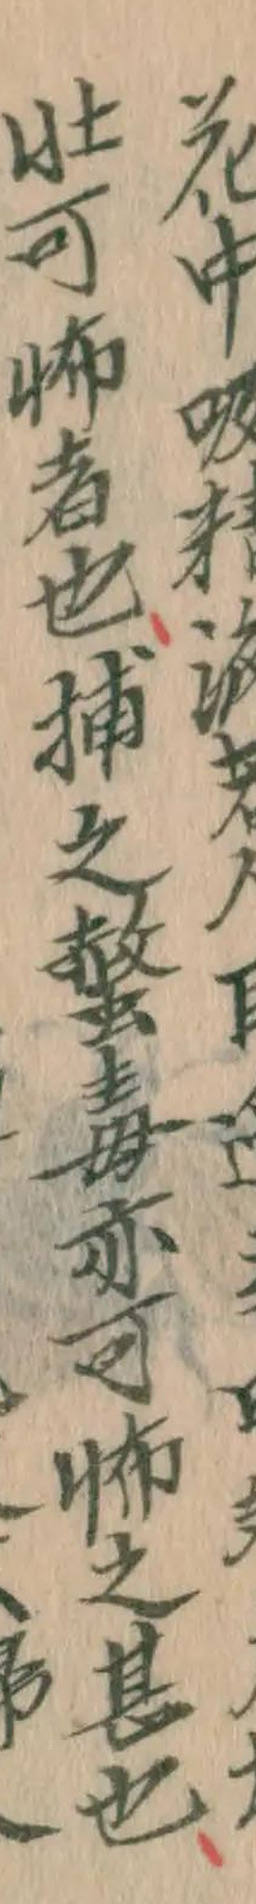壮可怖者也、捕之螫毒亦可怖之甚也、
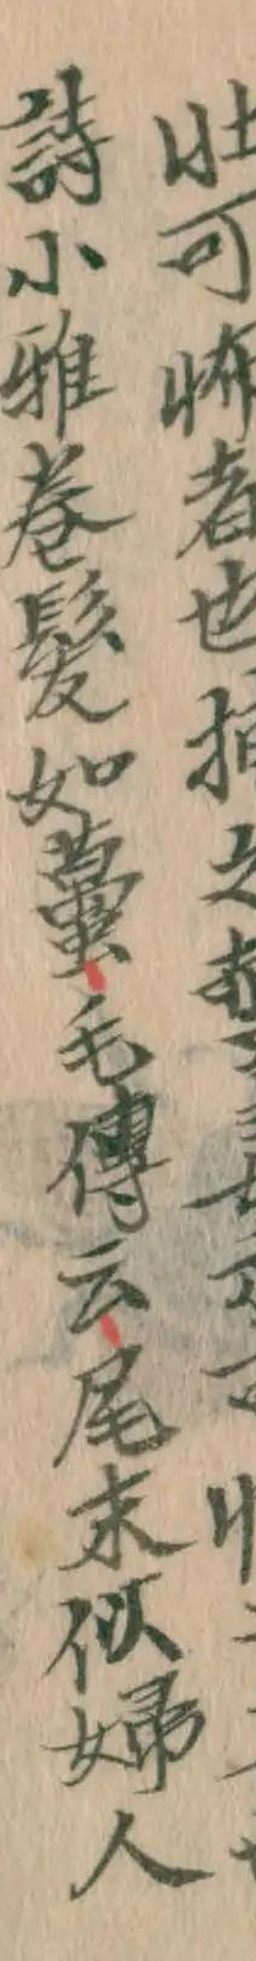詩小雅巻髮如蠆、毛傳云、尾末似婦人
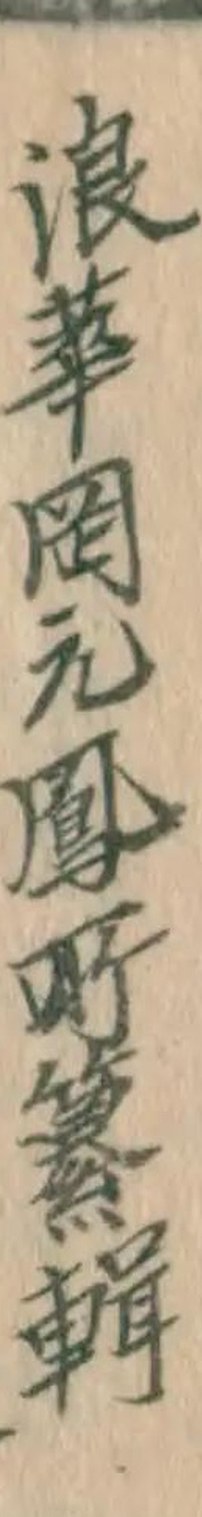浪華岡元鳳所纂輯
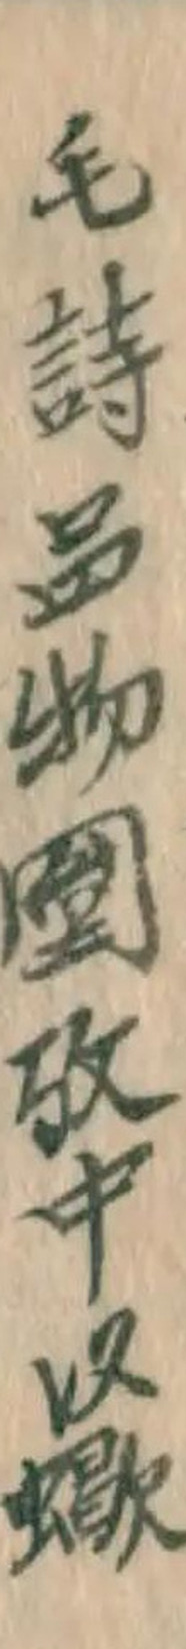毛詩品物圖中以蠍
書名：千蟲譜 3巻. [1]
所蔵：国立国会図書館 National Diet Library, JAPAN
